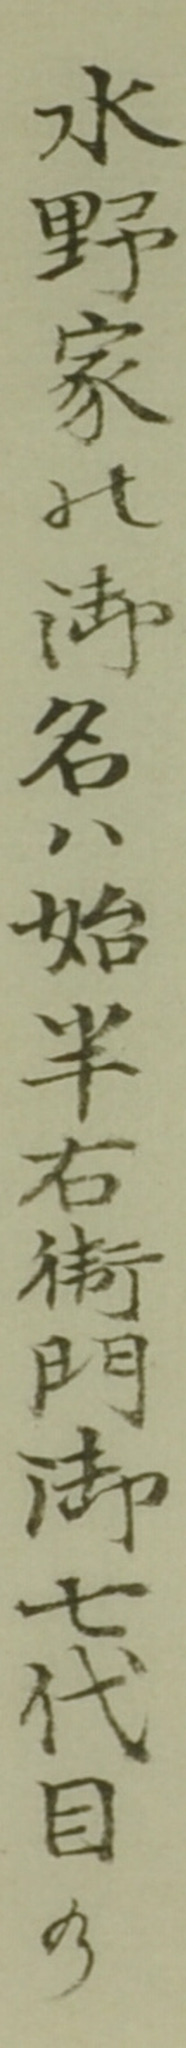水野家の御名は始半右衛門御七代目の
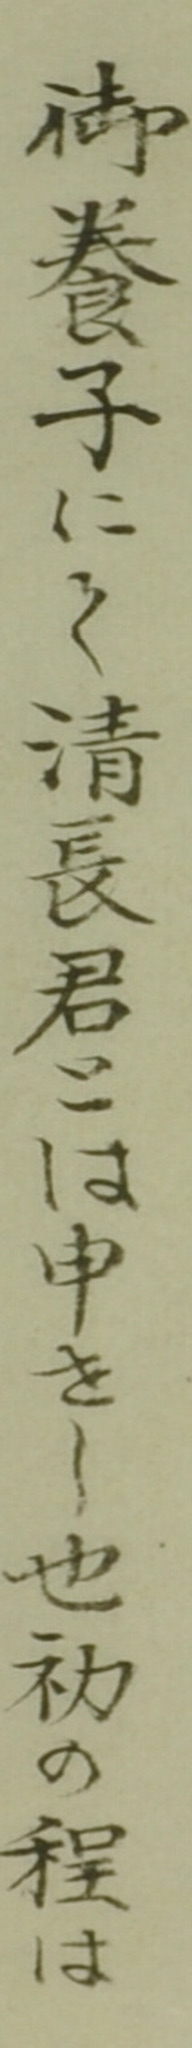御養子にて清長君とは申せし也初の程は
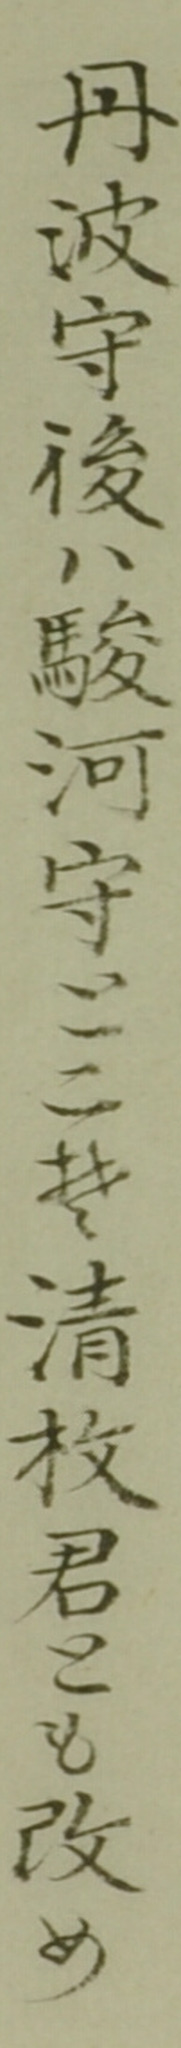丹波守後は駿河守とこそ清枚君とも改め
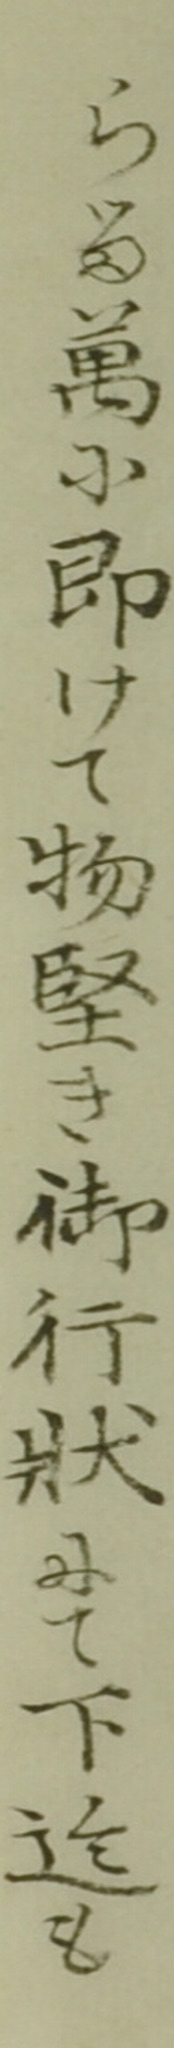らる万に即けて物堅き御行状にて下迄も

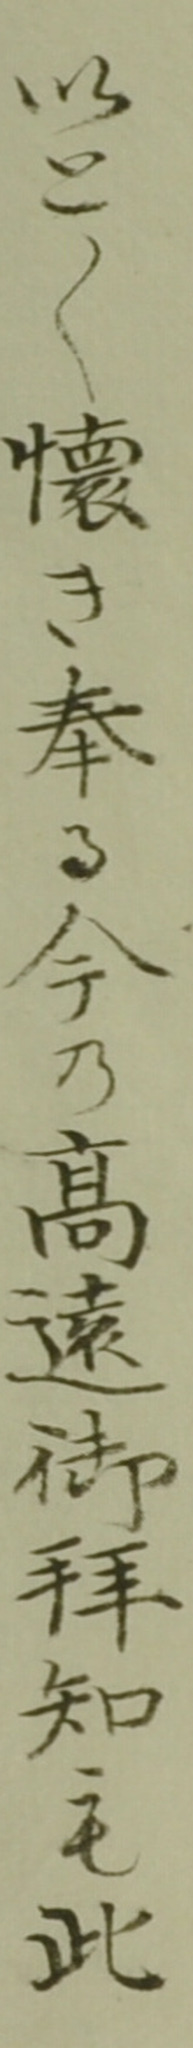いと〳〵懐き奉る今の高遠御拝知も此
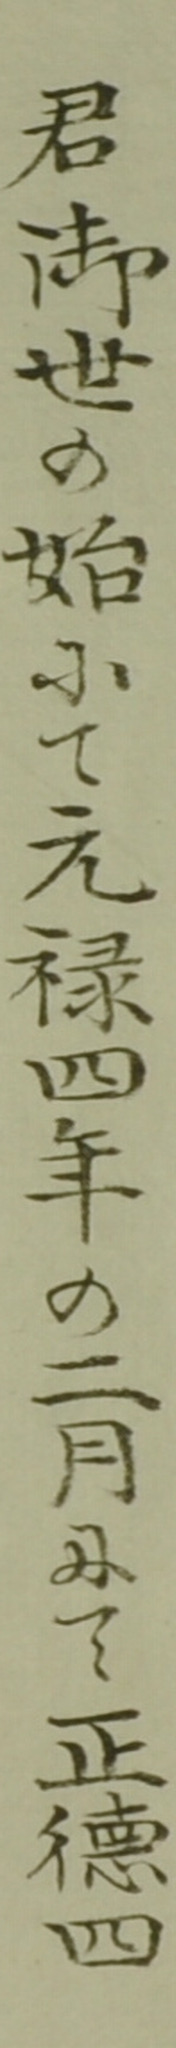君御世の始にて元禄四年の二月にて正徳四
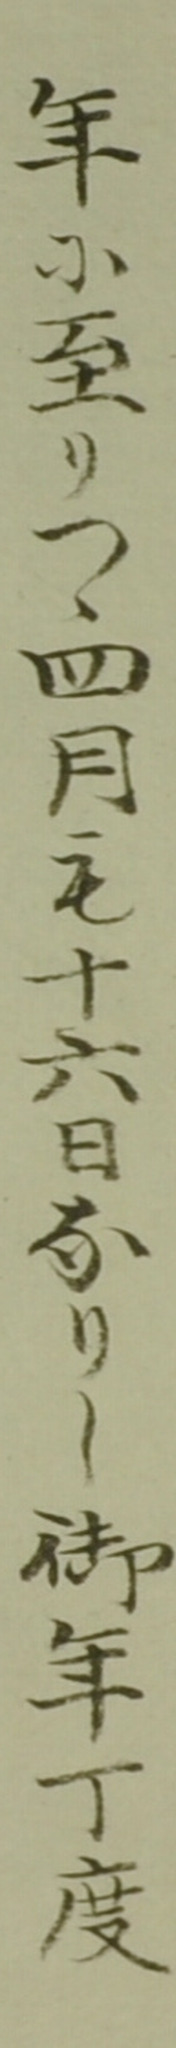年に至りつゝ四月も十六日なりし御年丁度
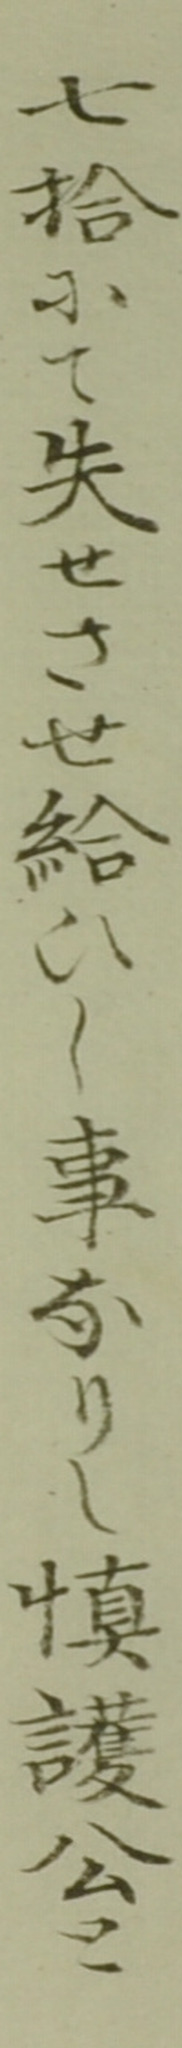七拾にて失せさせ給ひし事なりし慎護公と
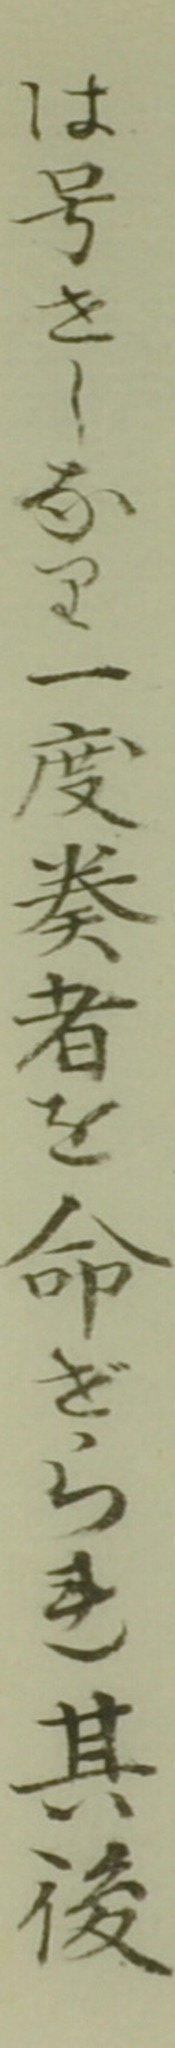は号せしなり一度奏者を命ぜられ其後
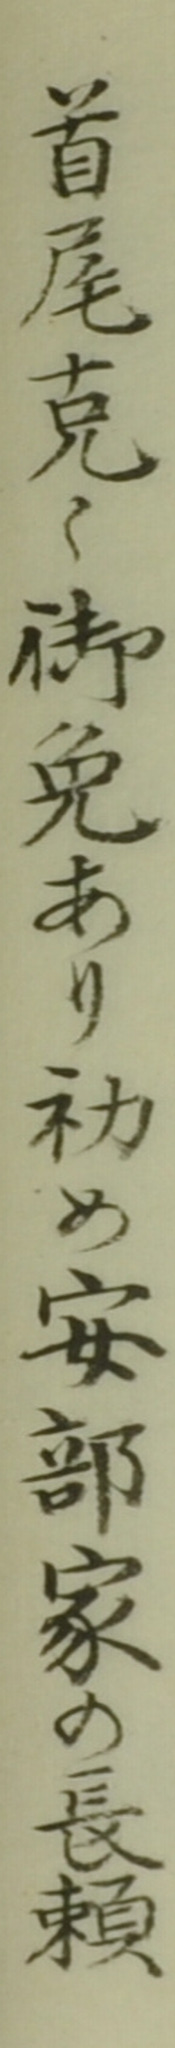首尾克く御免あり初め安部家の長頼
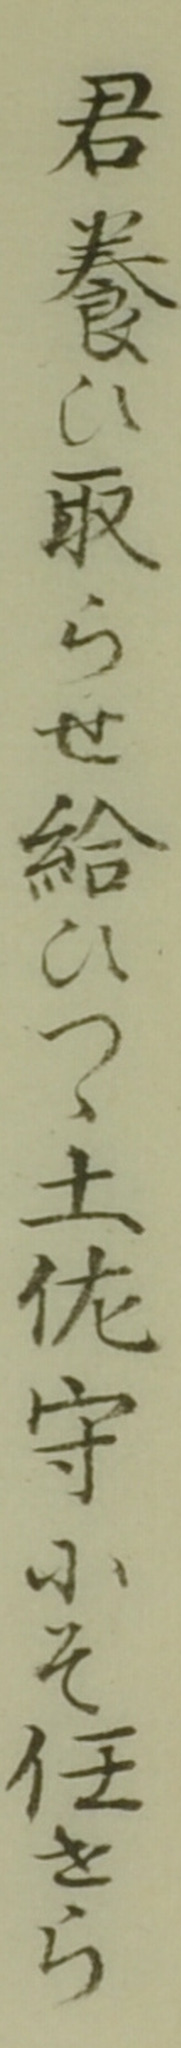君養ひ取らせ給ひつゝ土佐守にそ任せら
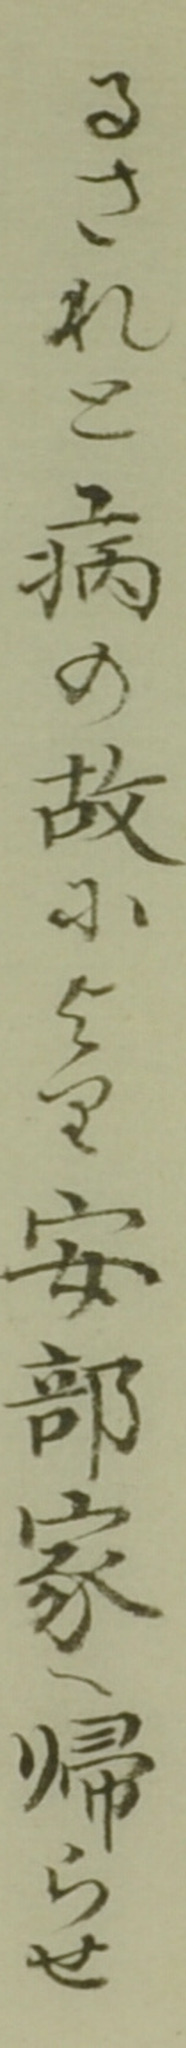るされと病の故により安部家へ帰らせ
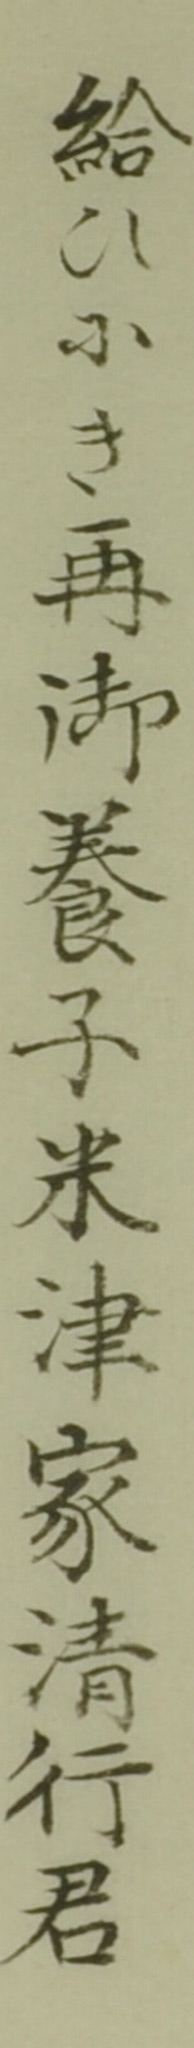給ひにき再御養子米津家清行君
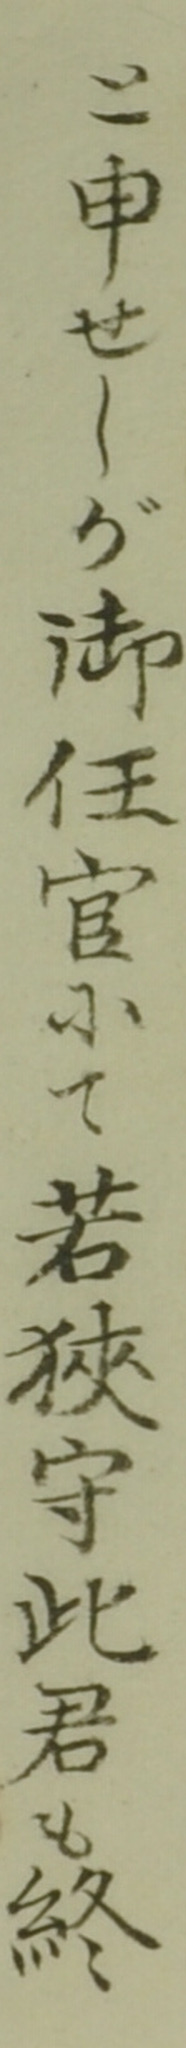と申せしが御任官にて若狭守此君も終
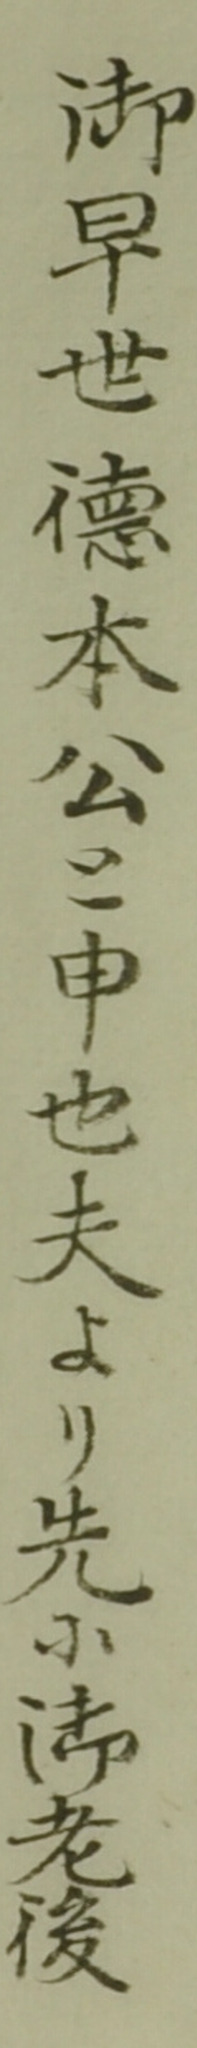御早世徳本公と申也夫より先に御老後
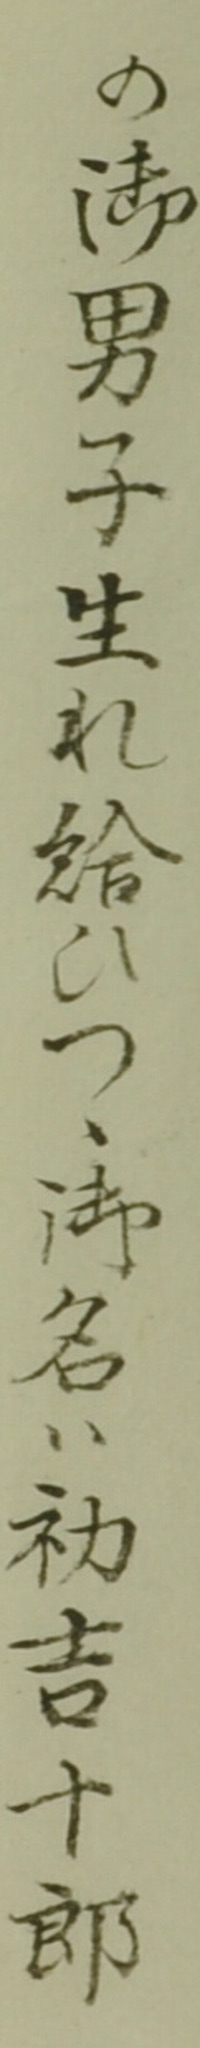の御男子生れ給ひつゝ御名ハ初吉十郎
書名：藤葛（全）
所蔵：伊那市立高遠町図書館・合同会社AMANE
